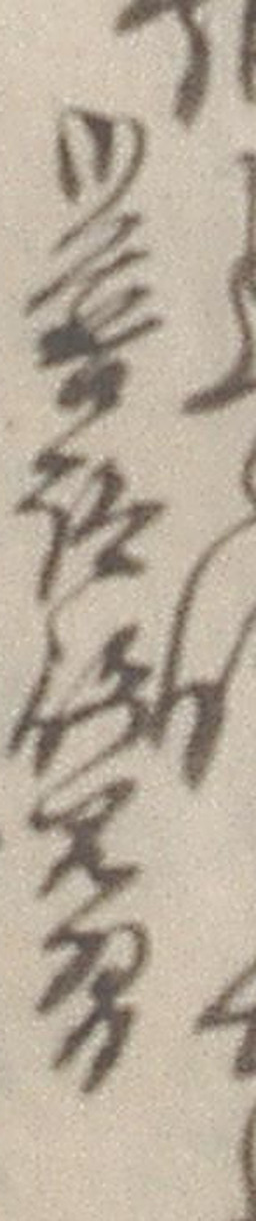御普請役見習
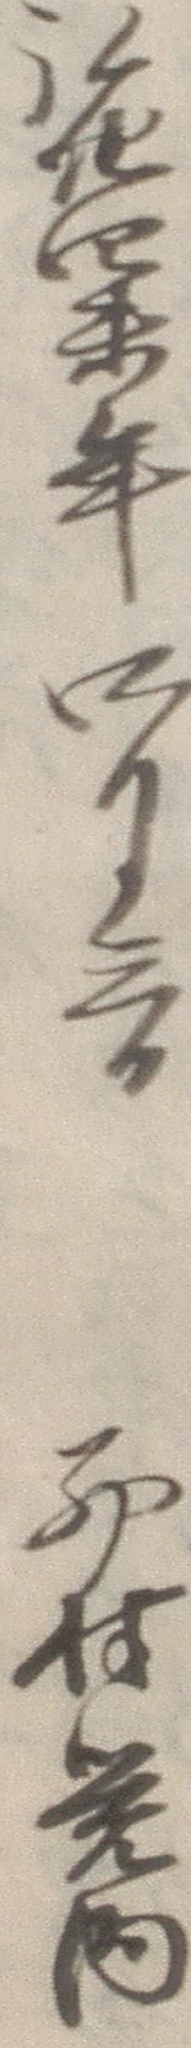弘化四未年四月三日西村覚内
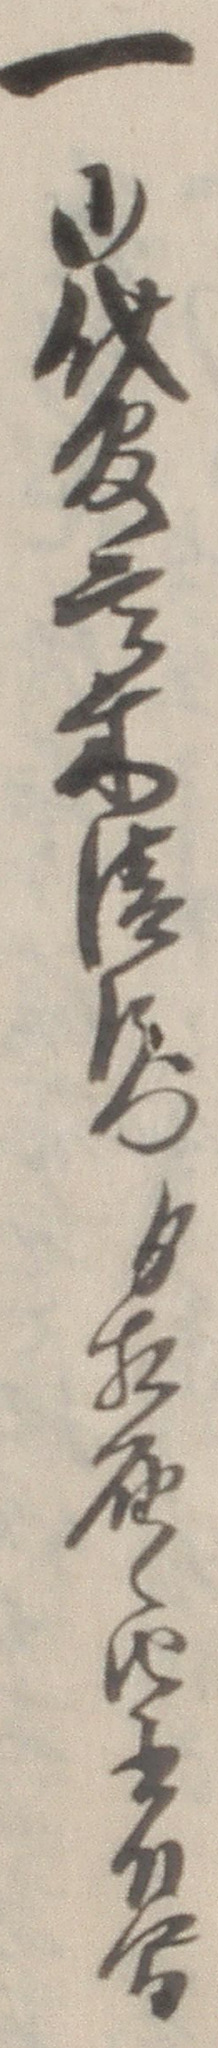一御代官高木清左衛門ゟ相届候由書付写
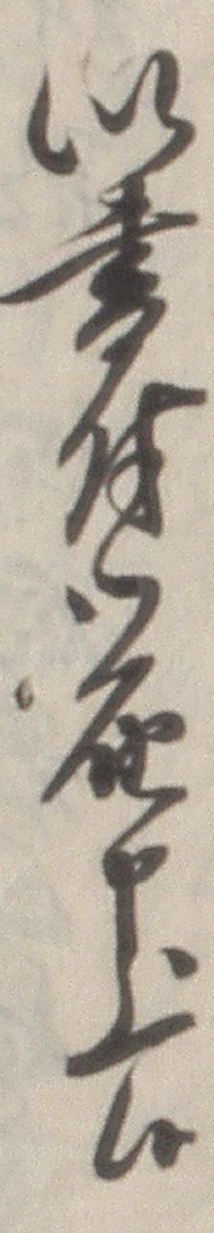以書付御届申上候
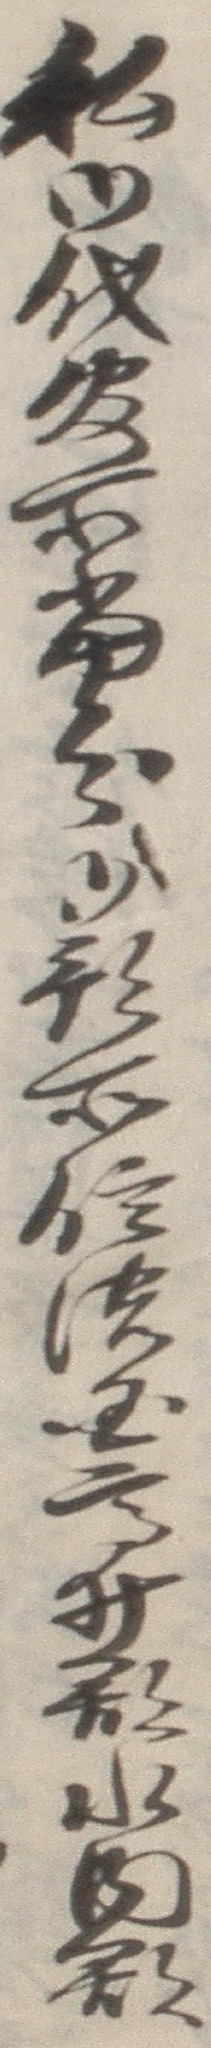私御代官所当分御預所信濃国高井郡水内郡
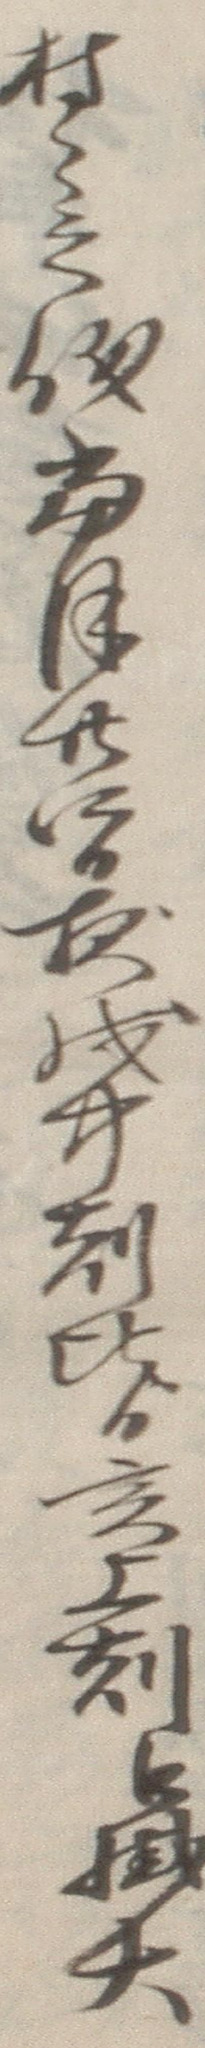村々之儀当月廿四日夜戌中刻比ゟ亥上刻江掛大
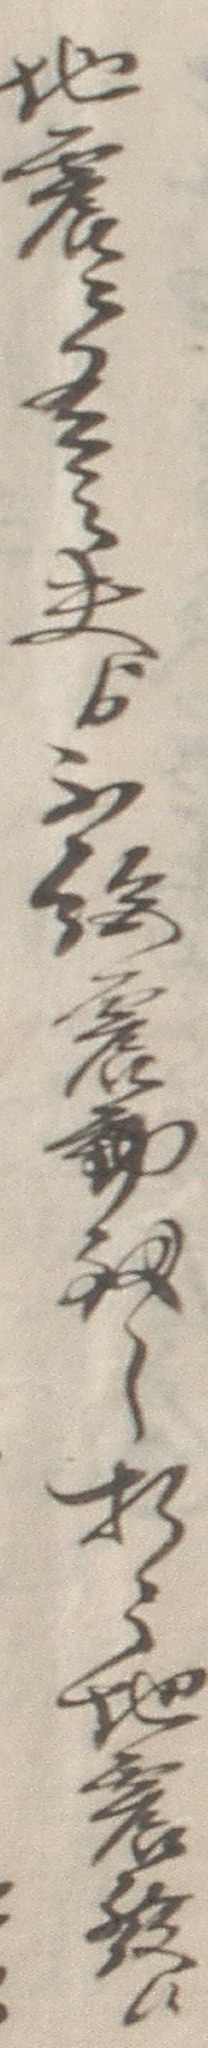地震二有之夫ゟ不絶震動致し折々地震致候
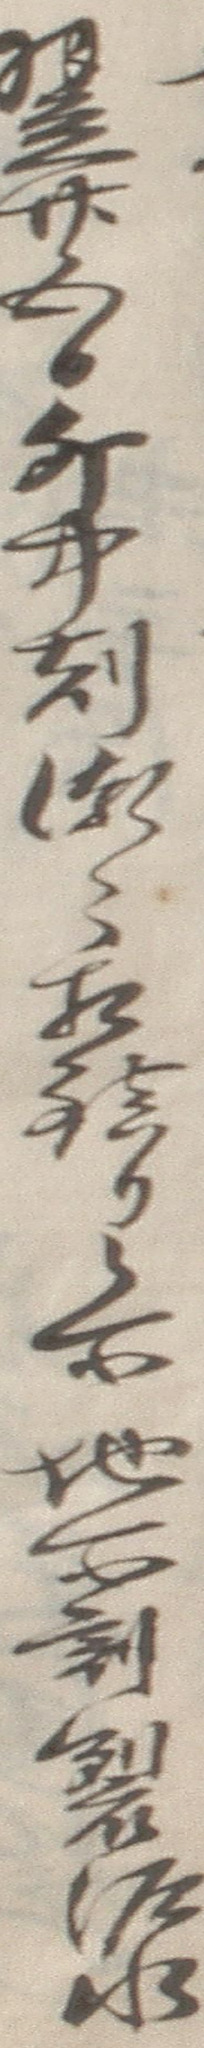翌廿五日卯中刻漸々相鎮候所地所割裂泥水
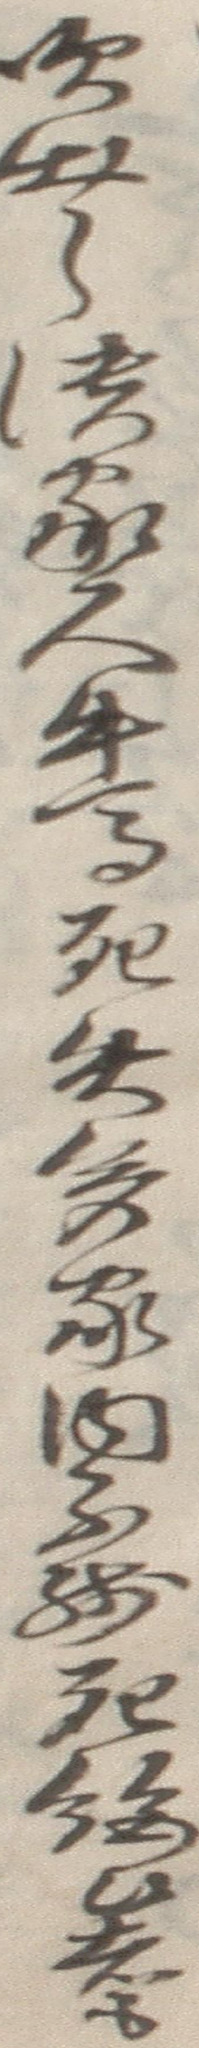吹出し潰家人牛馬死失多家内不残死絶候者も
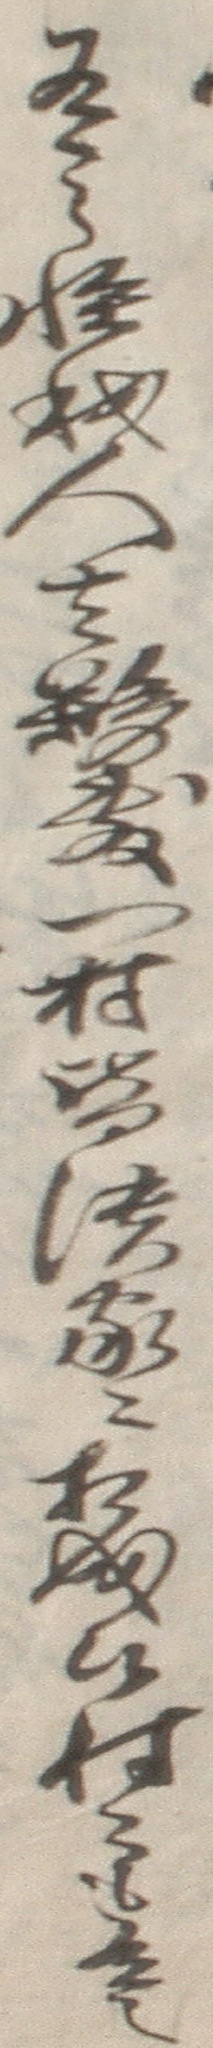有之怪我人は夥敷一村皆潰家に相成候村々も有之
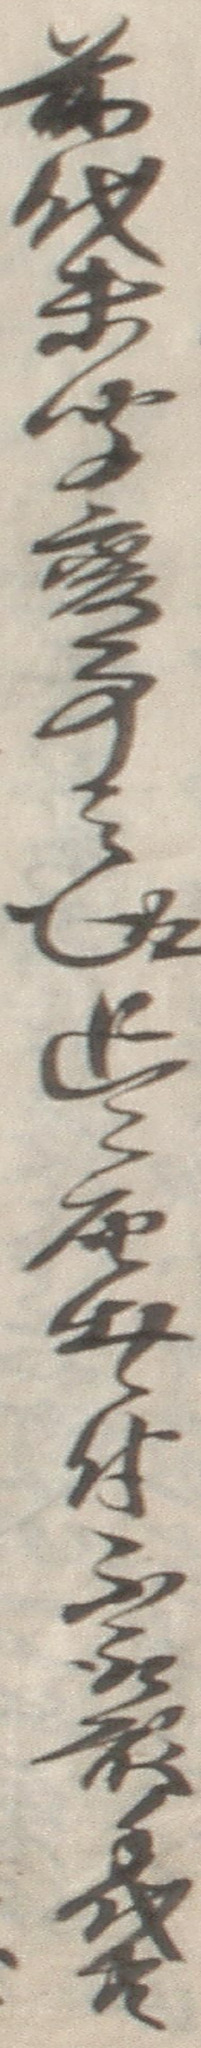前代未聞変事之趣追々届出候付不取敢手代共
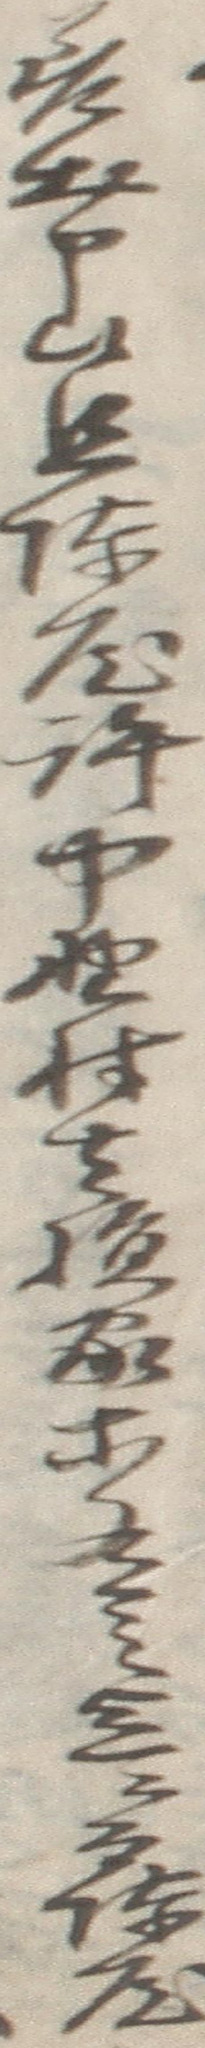差出申候且陣屋許中野村は損家等有之迄二而陣屋
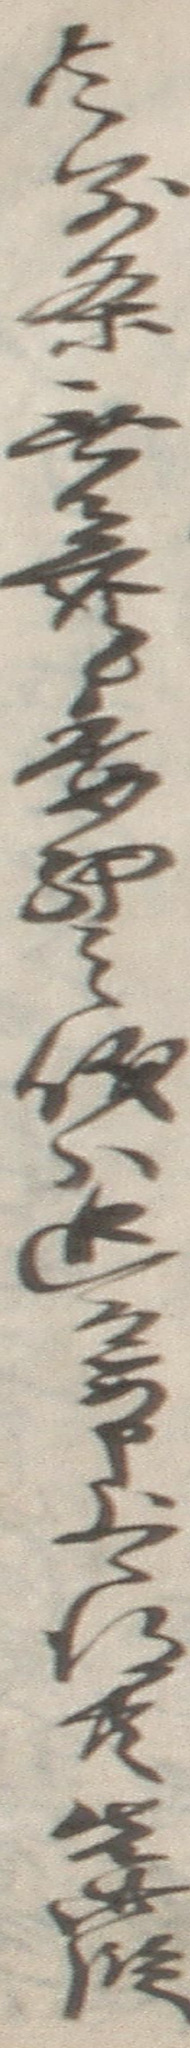共別条無御座候委細之儀ハ追々可申上候得共先此段
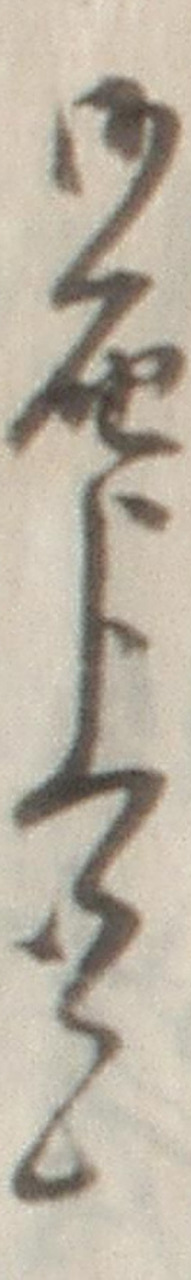御届申上候以上

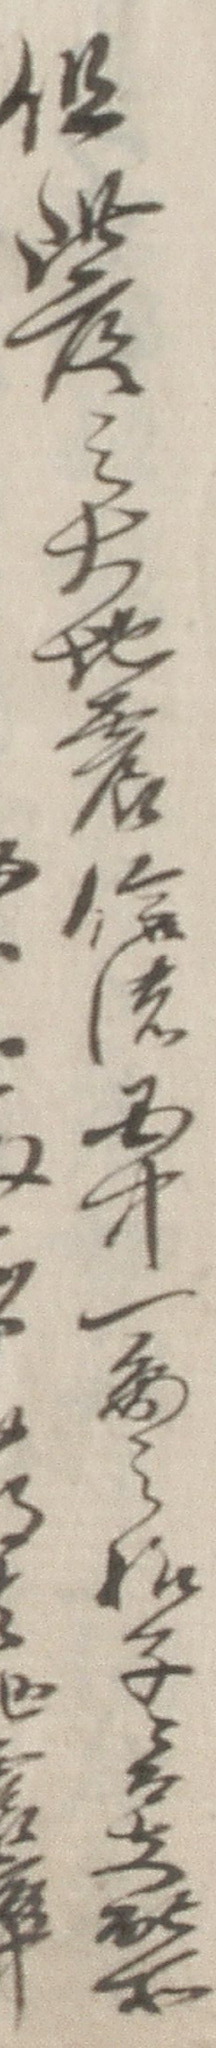但此度之大地震信濃国第一番之様子二而支配所
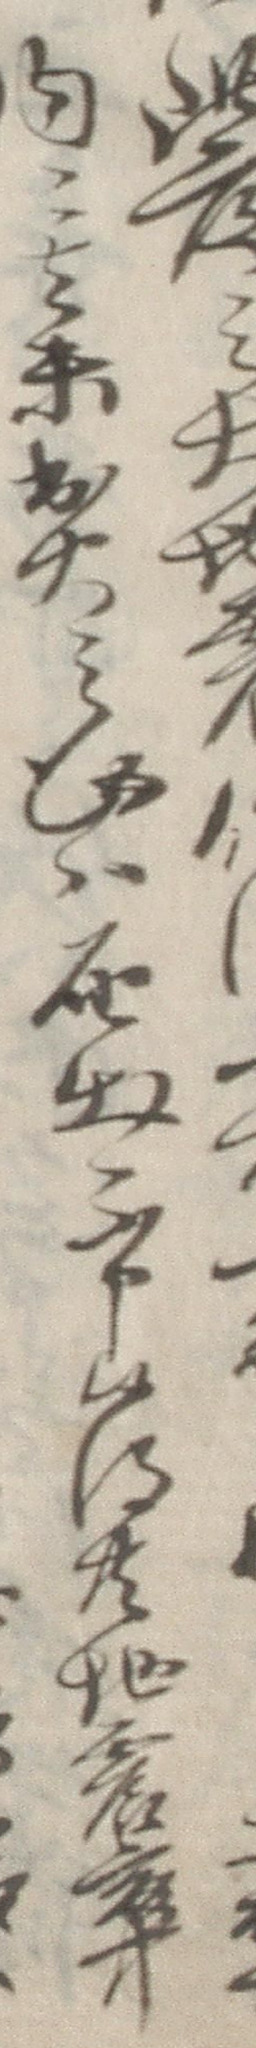内二は未出火之趣ハ届出不申候得共地震震中
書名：信州地震一件
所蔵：東京大学地震研究所図書室 Earthquake Research Institute Library, The University of Tokyo, JAPAN
